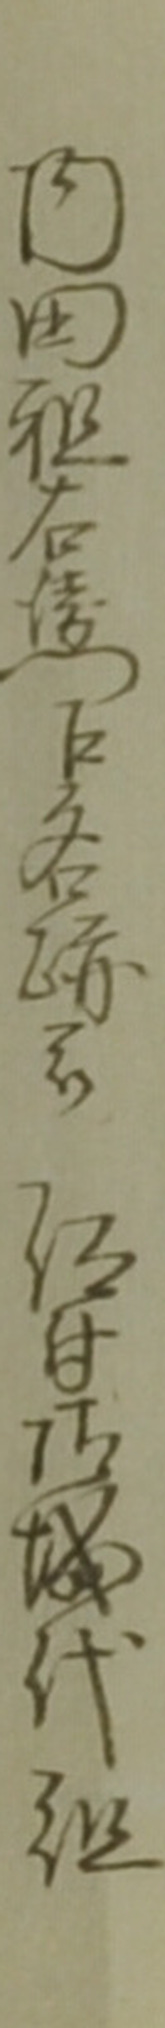内田祖右衛門江名跡被仰付御城代組
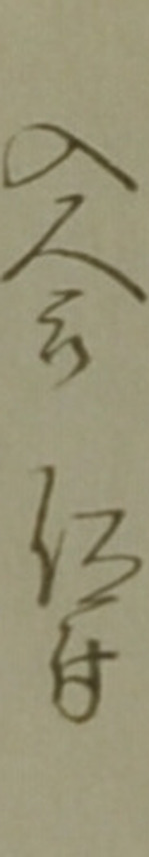入人被仰付
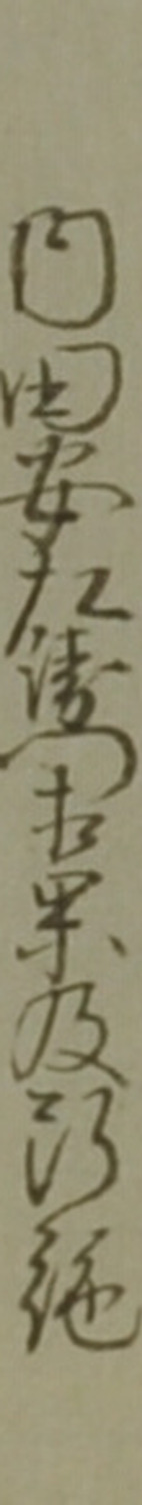一寛政内田安左衛門相果及断絶
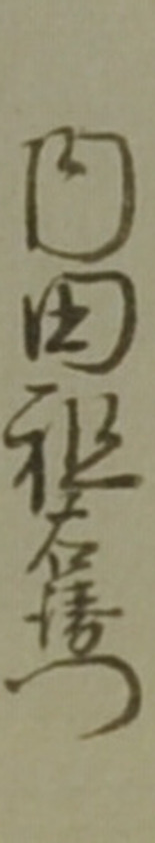内田祖右衛門
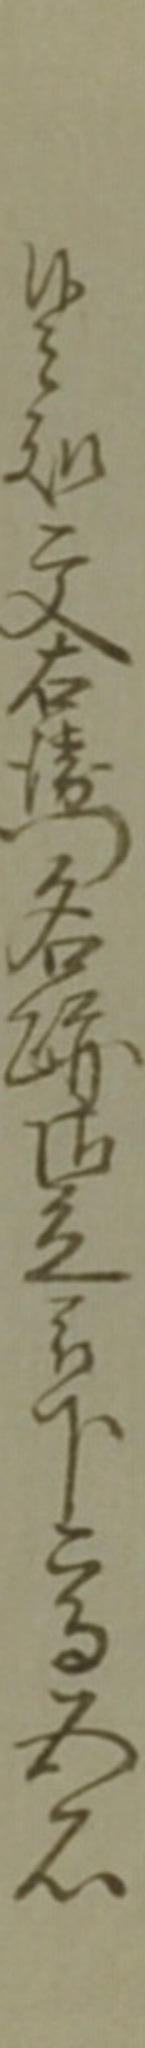候之処文右衛門名跡御立被下高五石
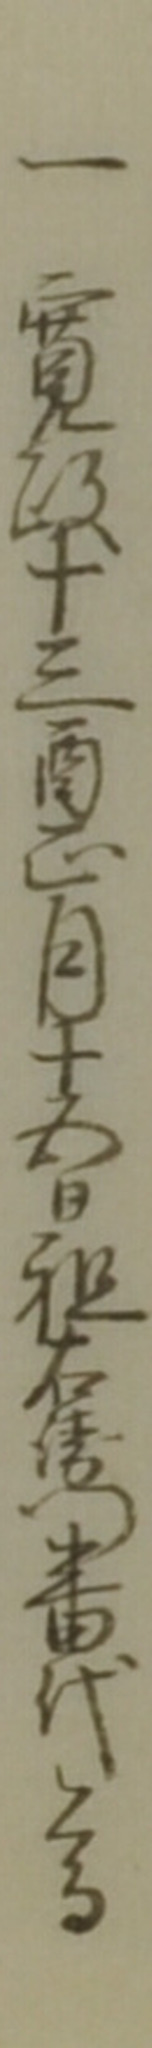一寛政十三酉正月十五日祖右衛門番代高
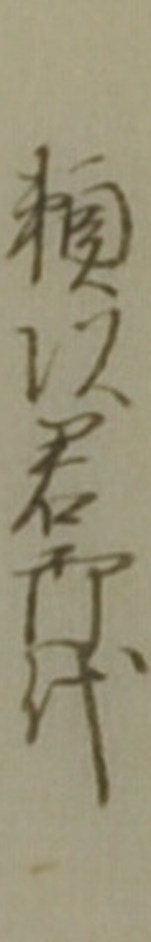頼以君御代
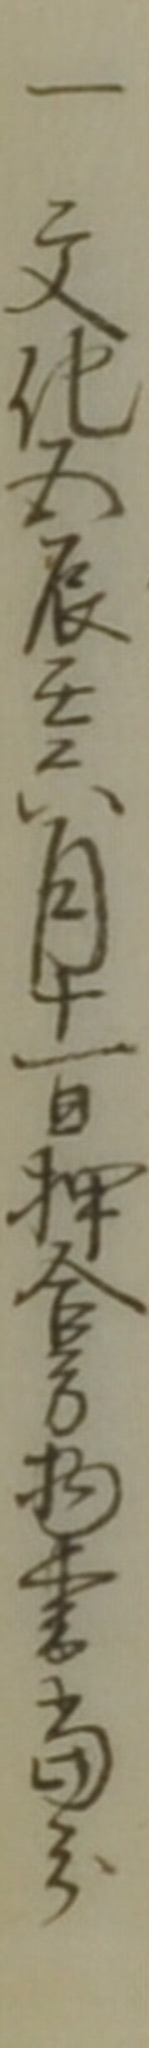一文化五辰閏六月十一日押合方物書当分
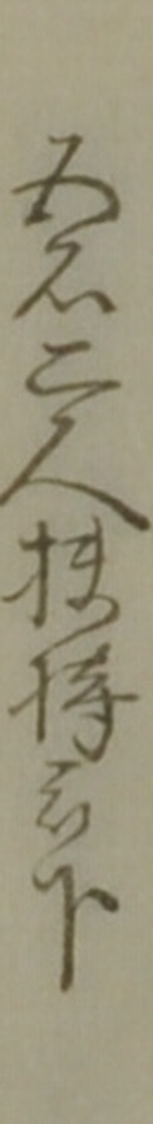五石二人扶持被下
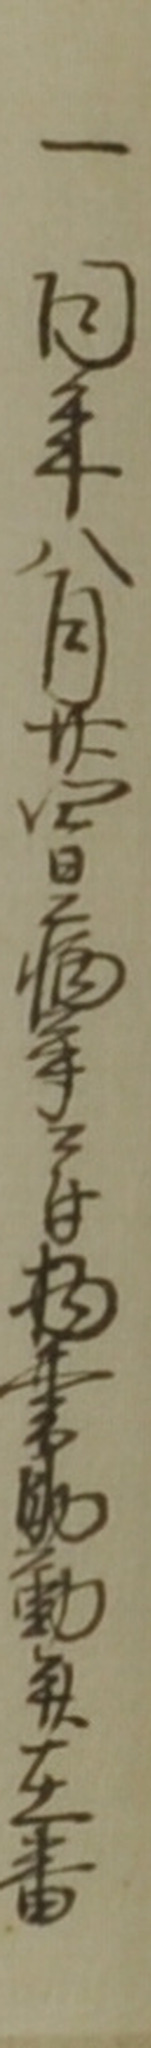一同年八月廿四日病気ニ付物書勤并在番
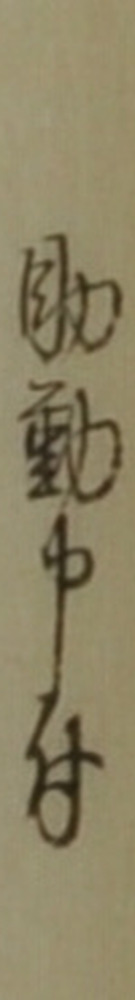助勤申付
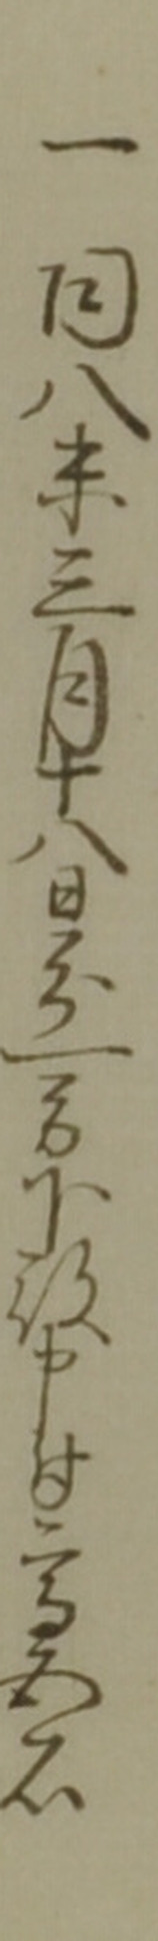一同八未三月十八日分一方下役申付高五石
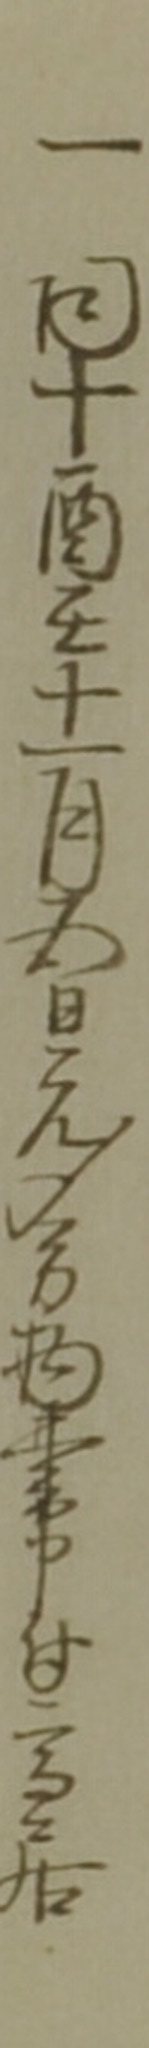一同十酉閏十一月五日元〆方物書申付高居
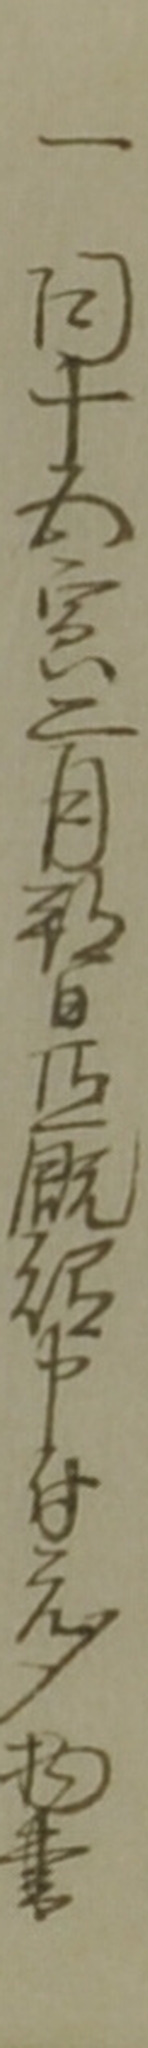一同十五寅二月朔日御厩賄申付元〆物書
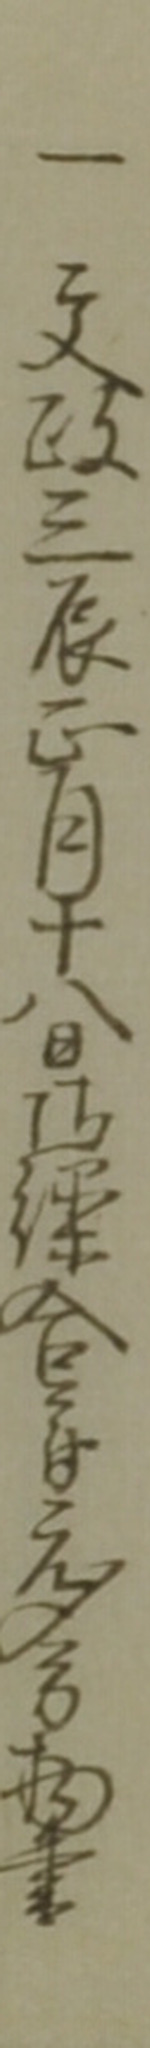一文政三辰正月十八日御繰合ニ付元〆方物書
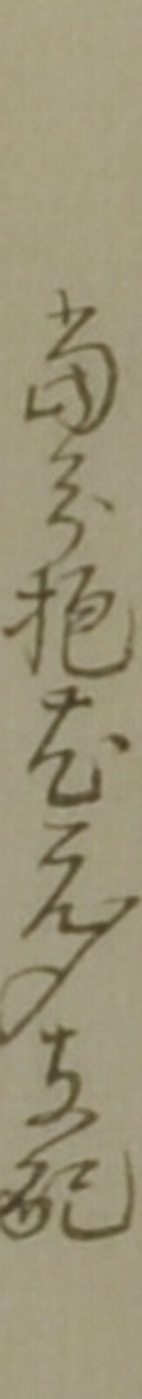当分抱尤元〆支配
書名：無足諸士勤仕録（七）
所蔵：伊那市立高遠町図書館・合同会社AMANE
